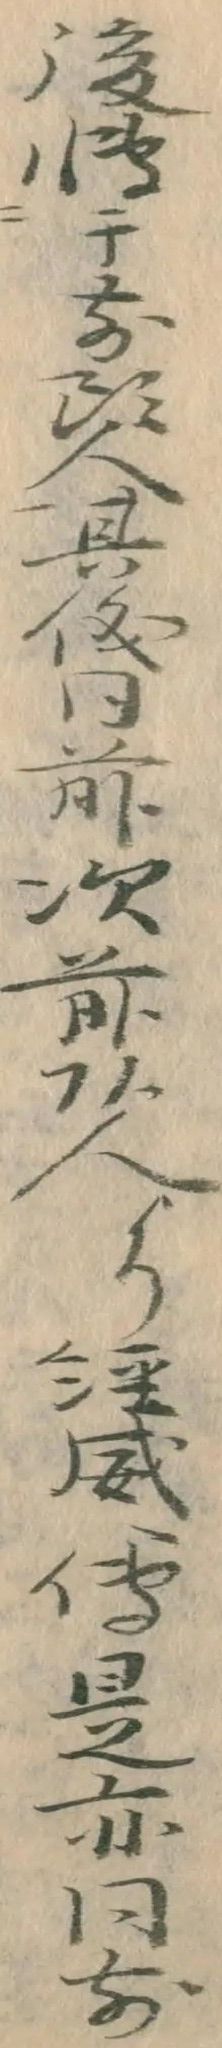後轉于前頭人其儀同前次前頭人より経威へ傳是亦同前

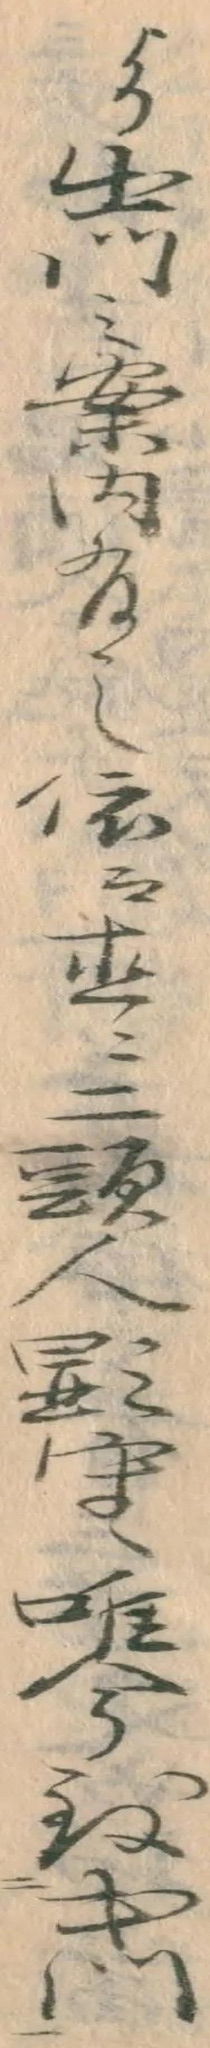より出門之案内有之依而直ニ二頭人顕守へ唯今致出門
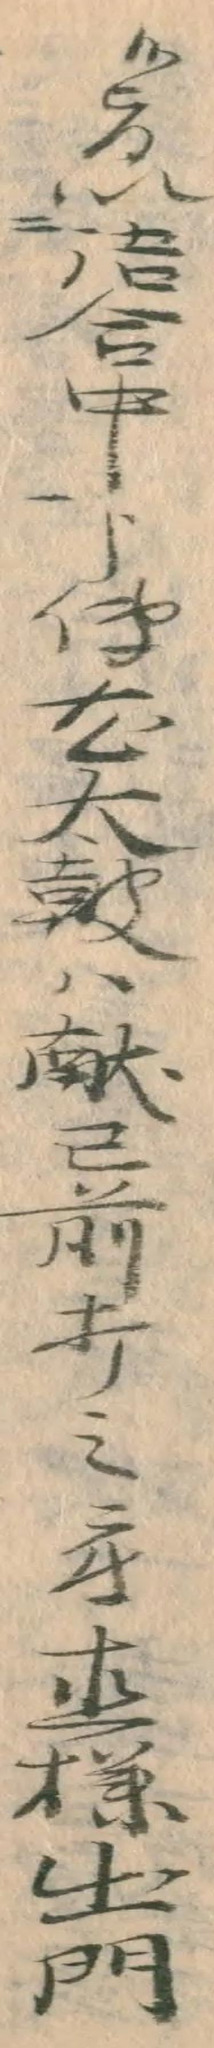候旨以語合中申傳尤太皷ハ献已前打之ニ付直様出門
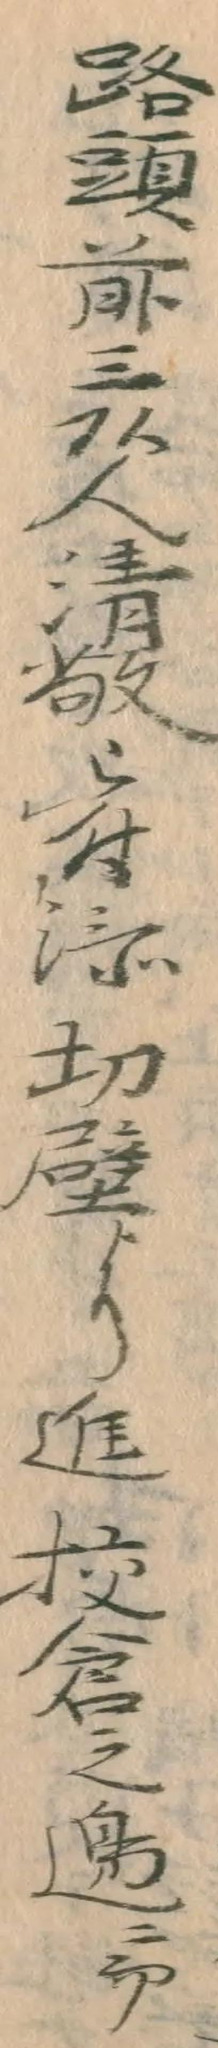路頭前三頭人清敬被付添切壁より進校倉之邊ニ而
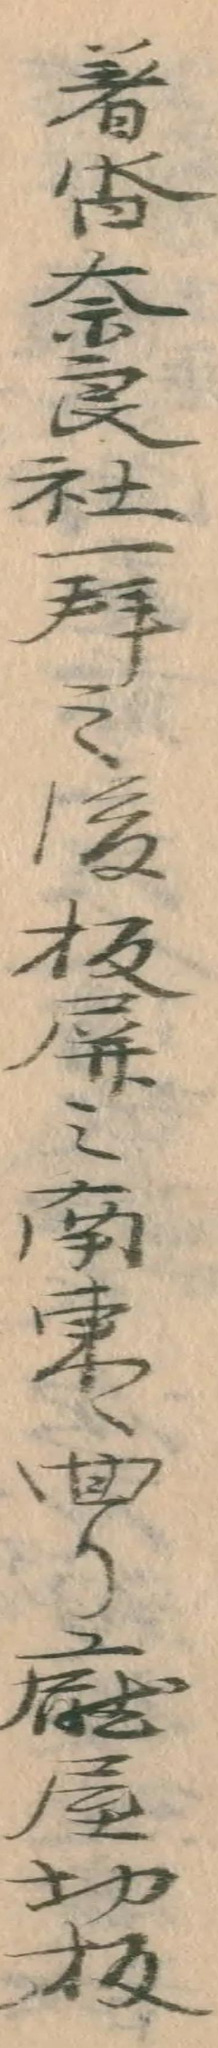着沓奈良社一拝之後板屏之南東へ曲り廰屋切板
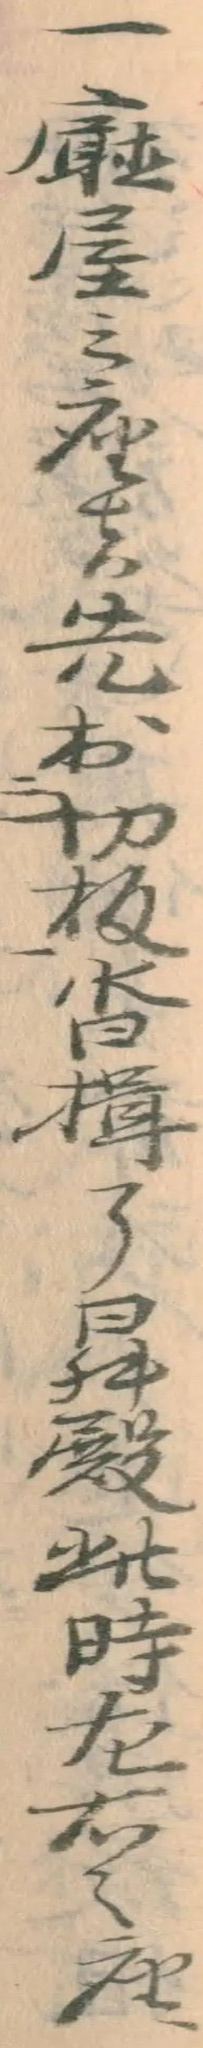一廰屋之座者先於切板沓揖了昇殿此時左右之座ヘ
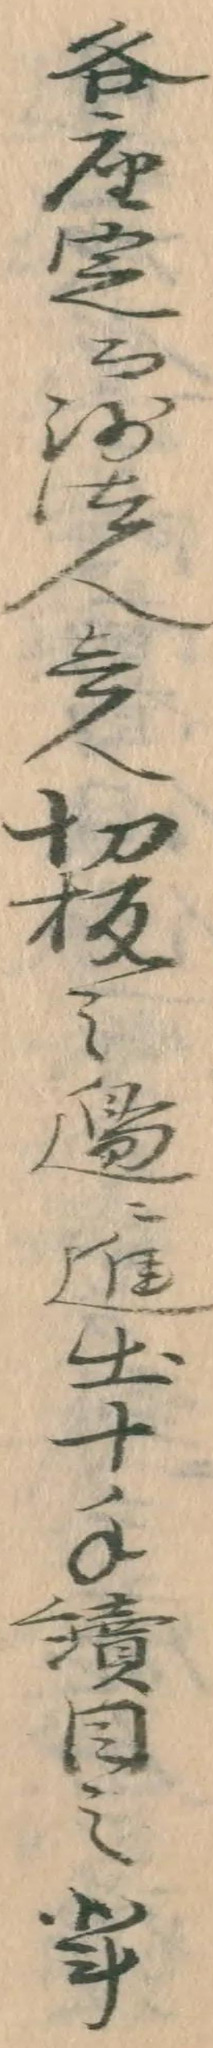各座定而沙汰人壱人切板之邊ニ進出十手續目之輩
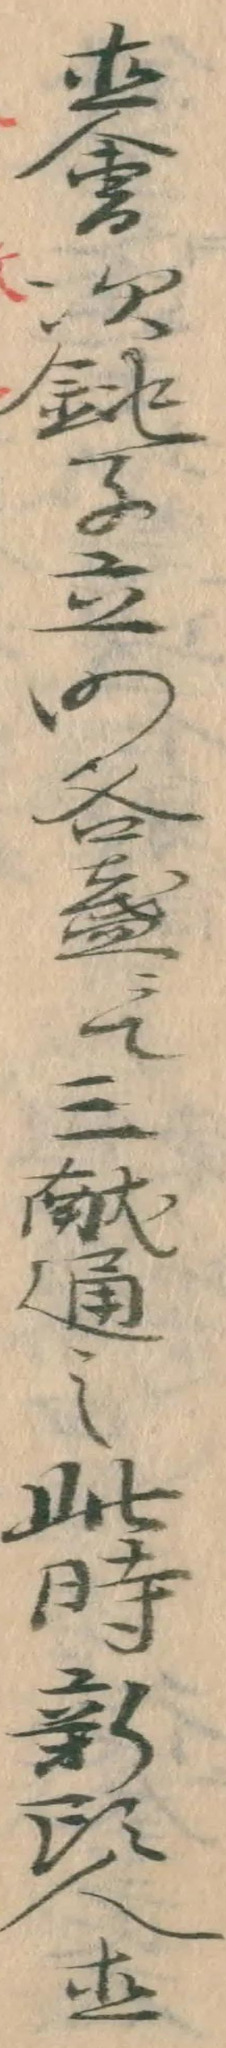直會次銚子立仍各盞ニて三献通之此時新頭人直
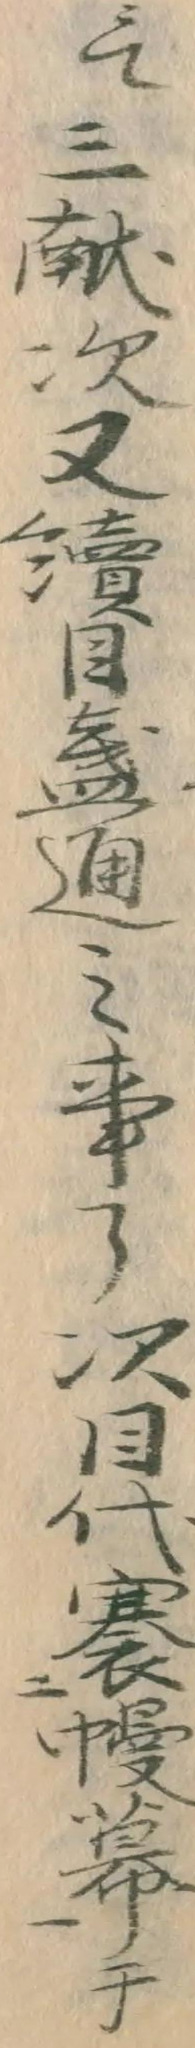ニて三献次又續目盞通之事了次目代褰幔幕于

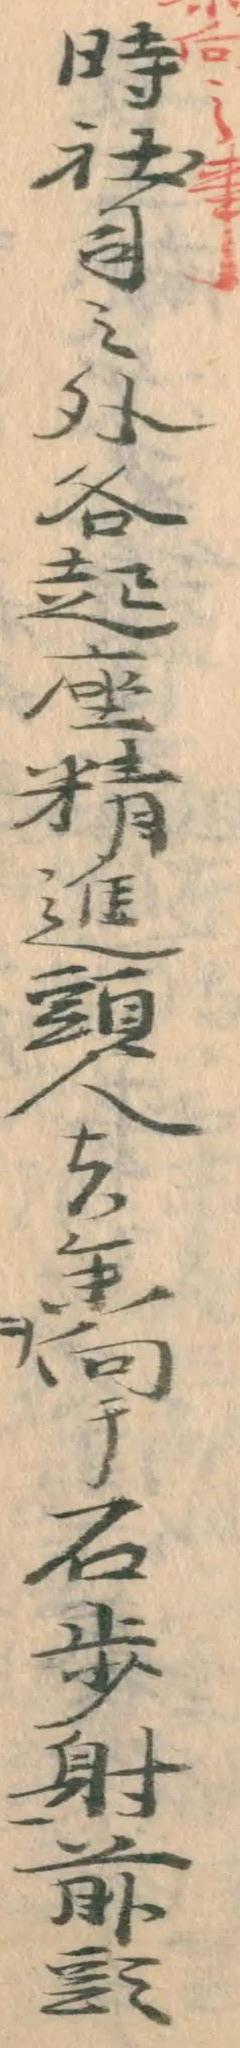時社司之外各起座精進頭人者参向于石歩射前頭
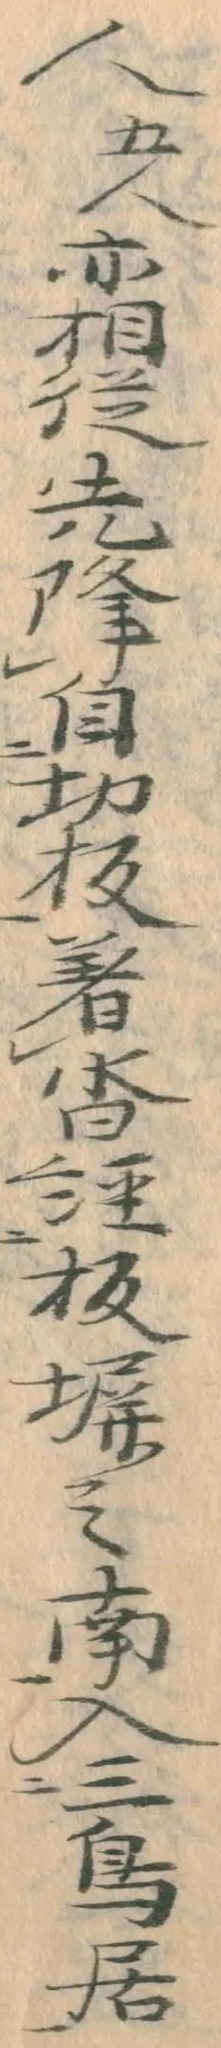人五人亦相従先降自切板着沓経板塀之南入三鳥居
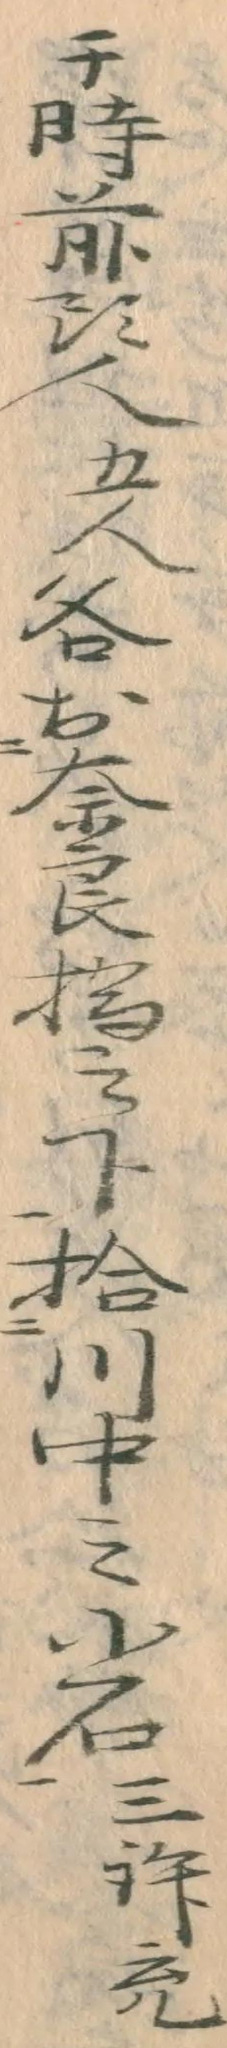于時前頭人五人各於奈良橋之下拾川中之小石三許宛
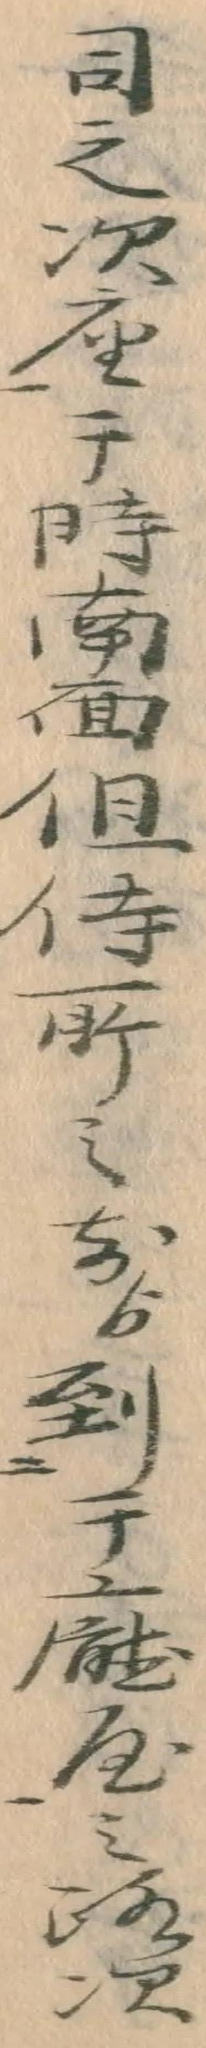司之次座于時南面但侍所之前ゟ到于廰屋之路次
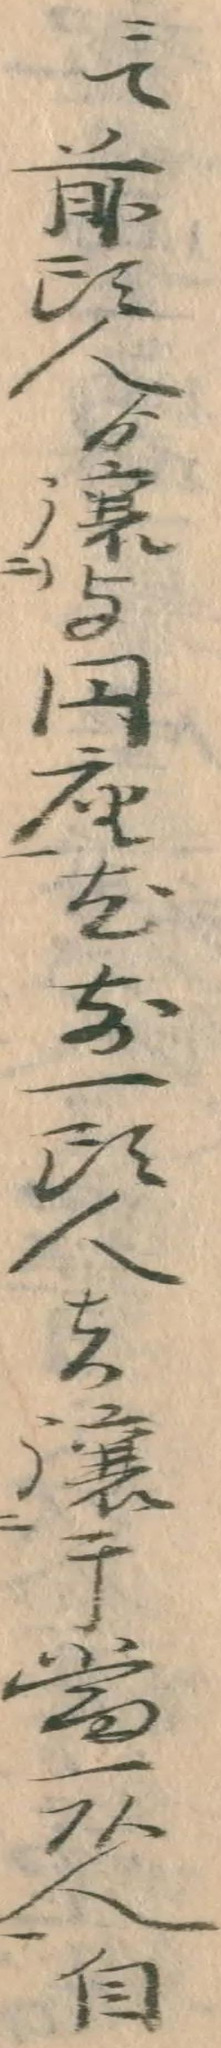ニて前頭人ゟ譲与円座尤前一頭人者譲于當一頭人自
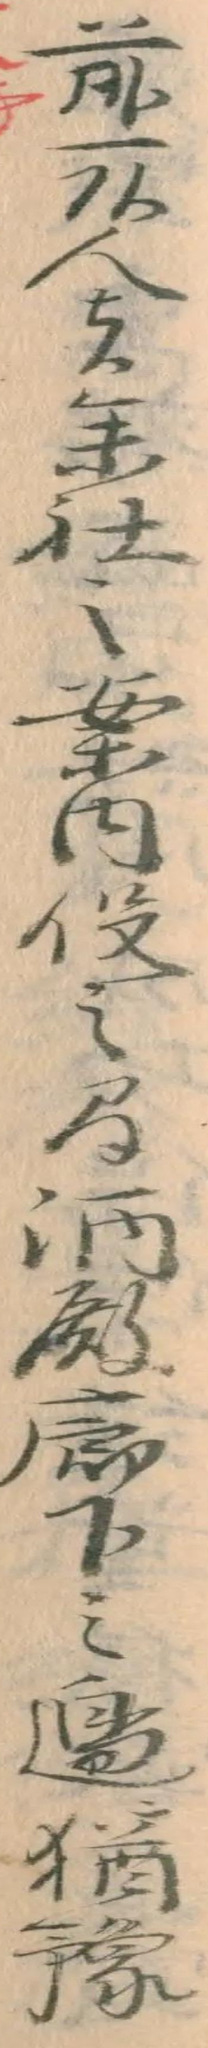前頭人者参社之案内役之間酒殿廊下之邊猶予
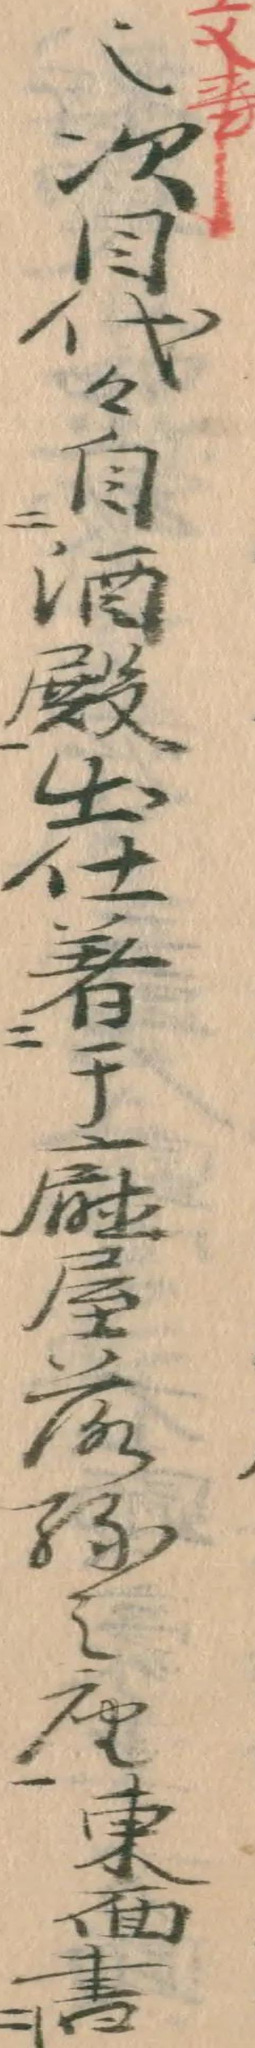也次目代々自酒殿出仕着于廰屋落縁之座東西書
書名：賀茂社記録. 第72冊
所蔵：国立国会図書館 National Diet Library, JAPAN
